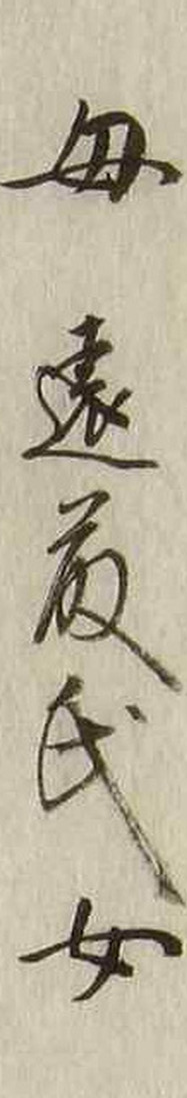母遠藤氏女
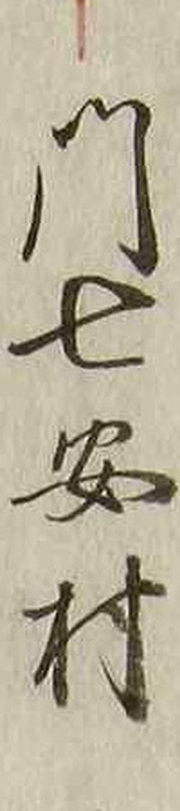門七安村
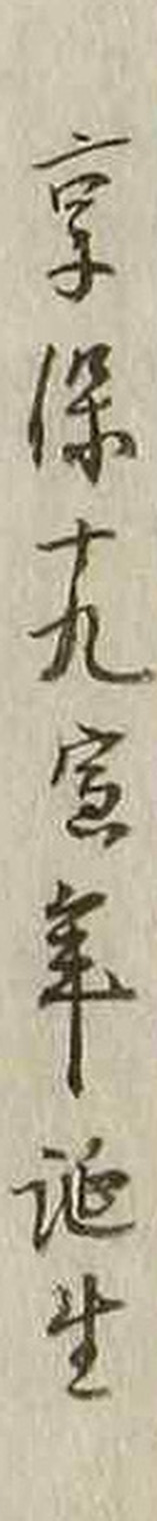享保十九と寅年誕生
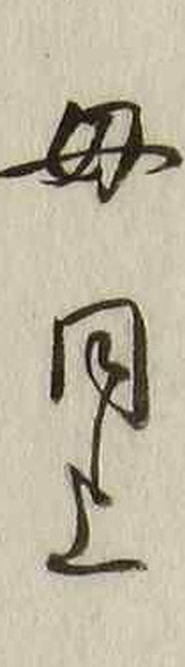母同上
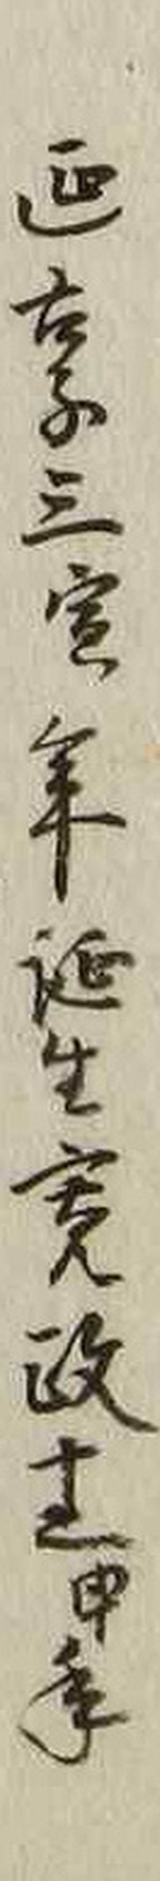延享三寅年誕生寛政十二申年
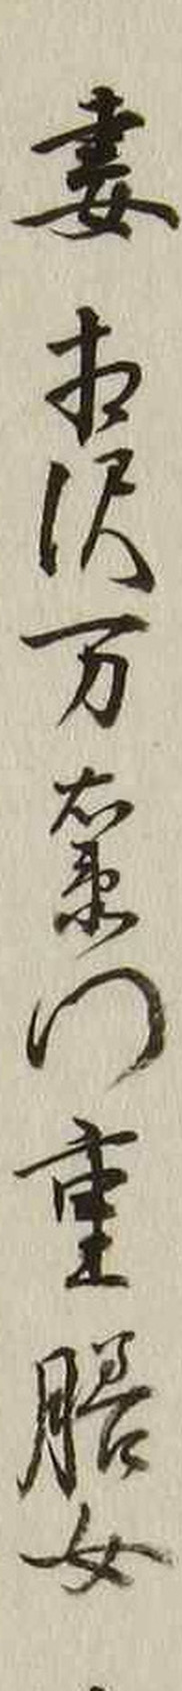妻相沢万右衛門重膳女
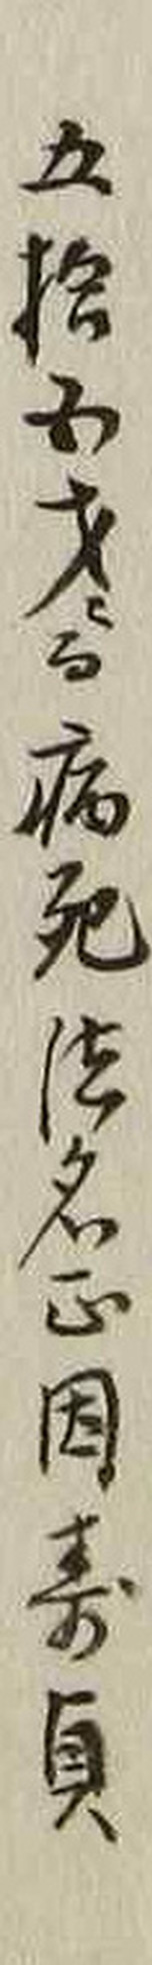五拾五才二て病死法名正因寿貞
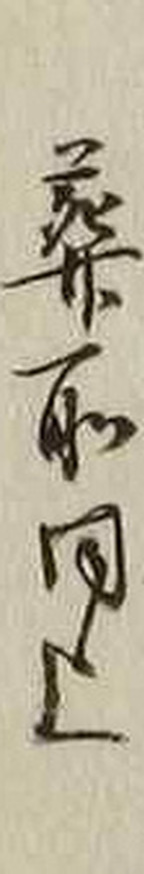葬所同上
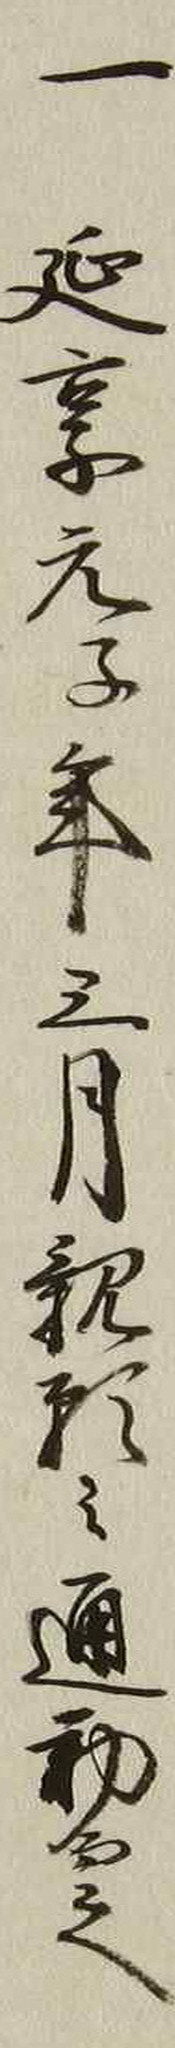一延享元子年三月親願之通勤めて之
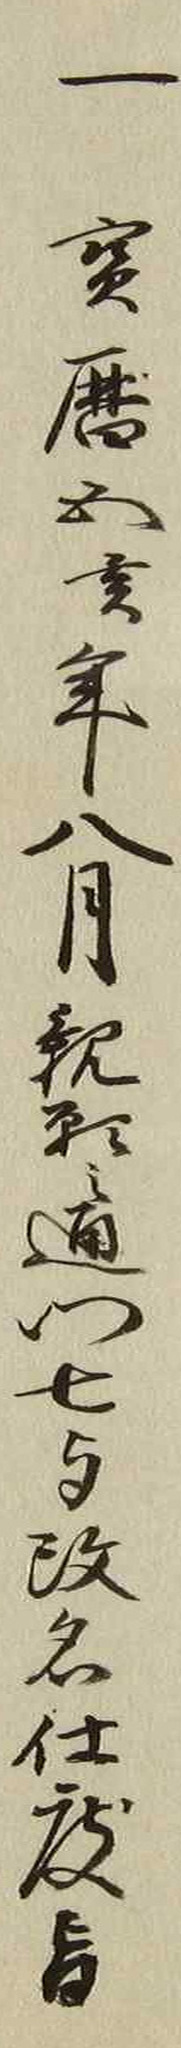一宝暦五亥年八月親願之通門七と改名仕り度旨
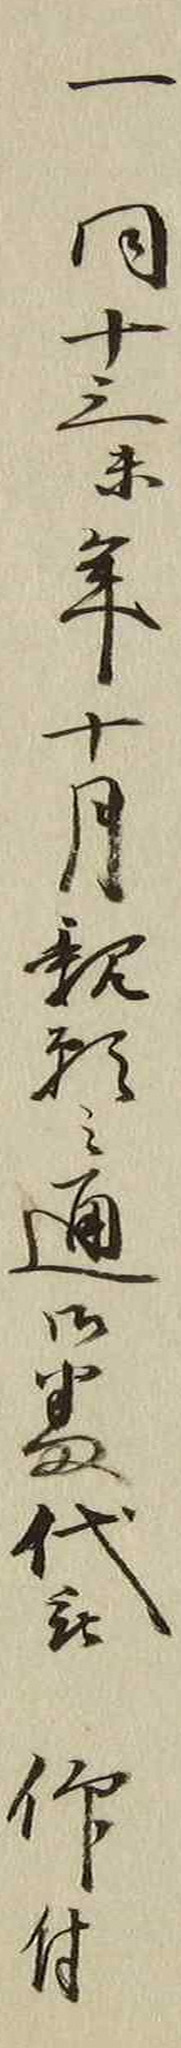一同十三未年十月親願之通御番代仰せ付けられ
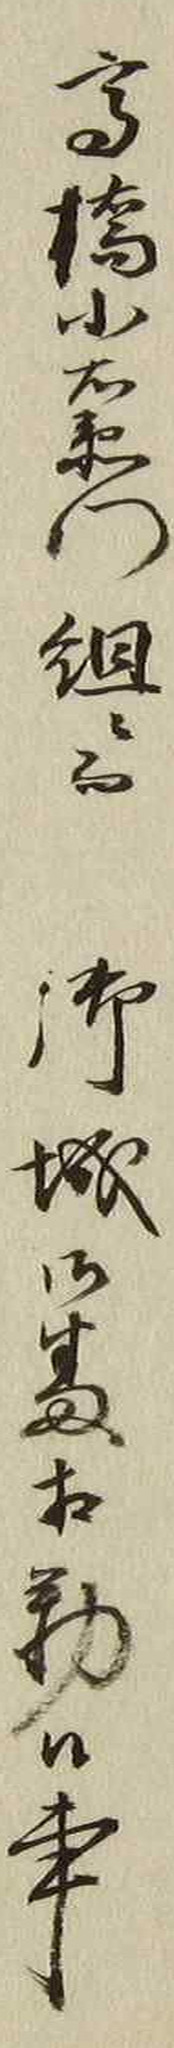高橋小右衛門組二て御城御番相勤め候事
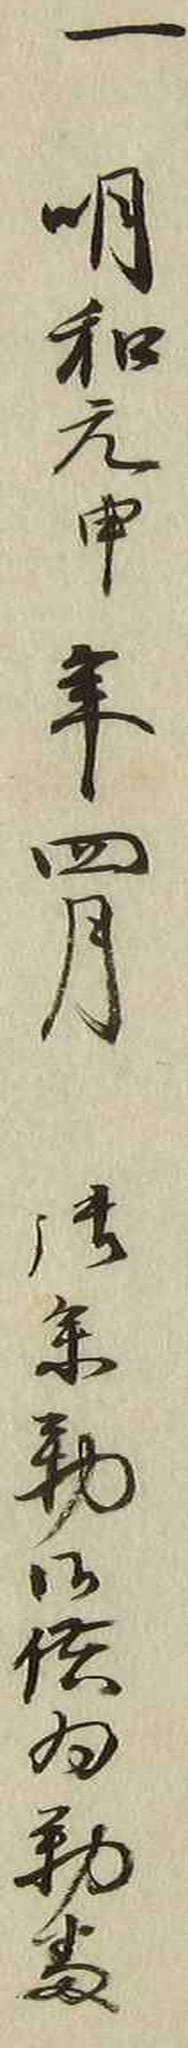一明和元申年四月御参勤御供勤番之為
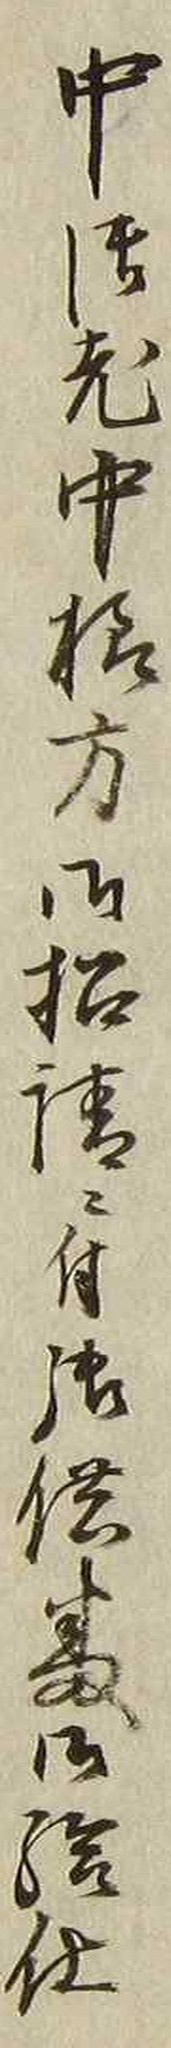中御老中様方御招き請け二御供之番給仕
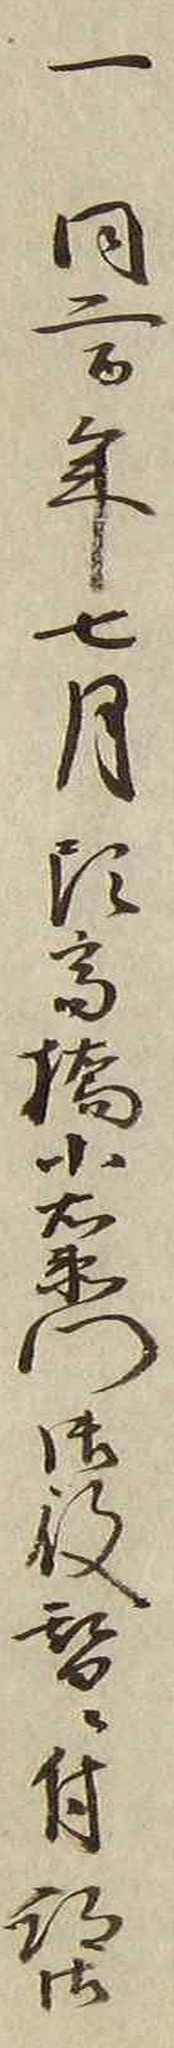一同二酉年七月頭高橋小右衛門御役替えニ付き郡御

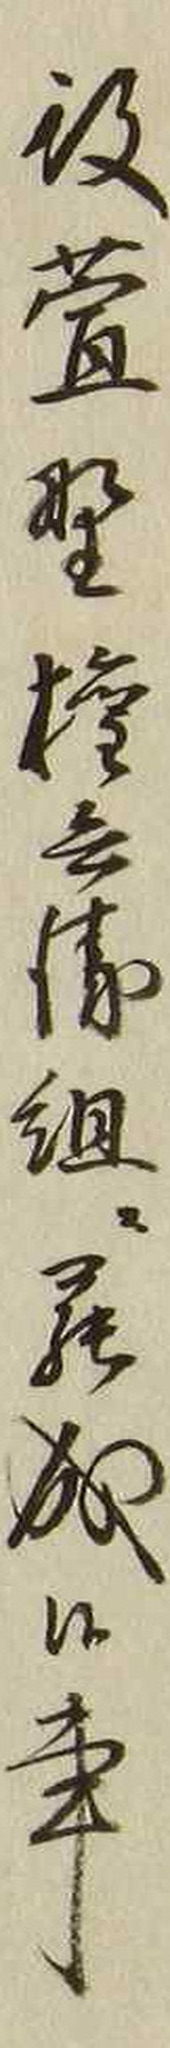役萱野権兵衛組ニ罷り成り事
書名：諸士系譜　巻之19　い之部19
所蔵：会津若松市立会津図書館
